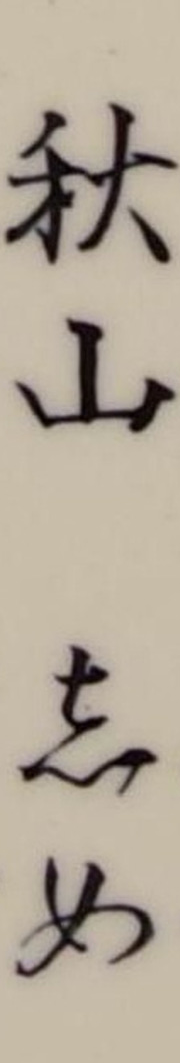秋山しめ
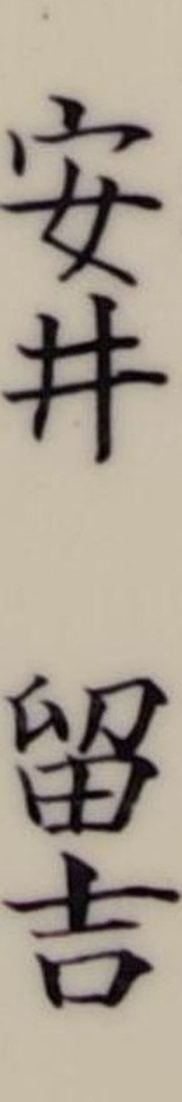安井留吉
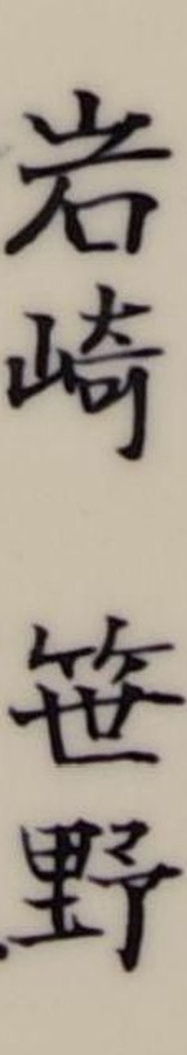岩崎笹野
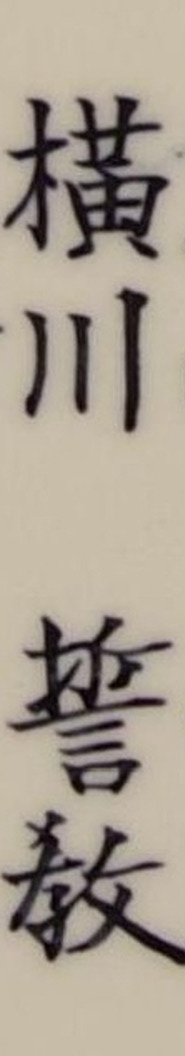横川誓教
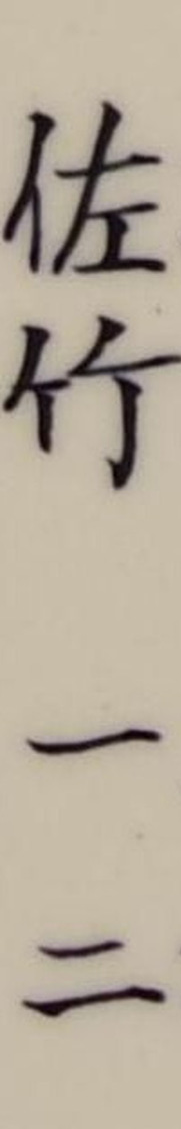佐竹一二
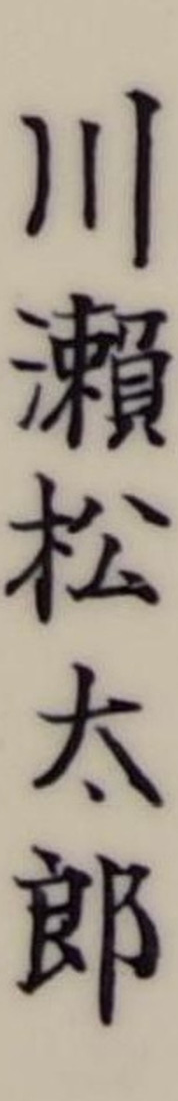川瀬松太郎
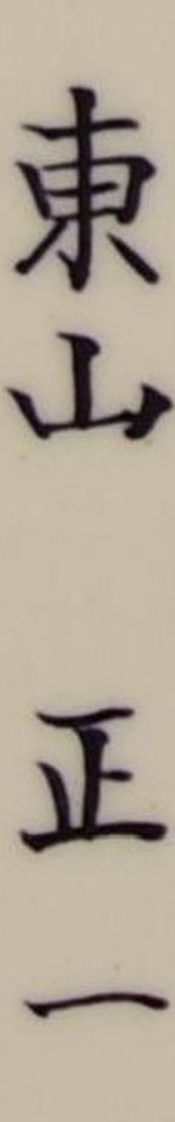東山正一
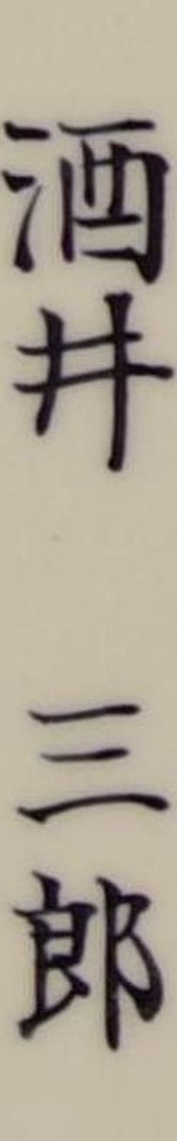酒井三郎
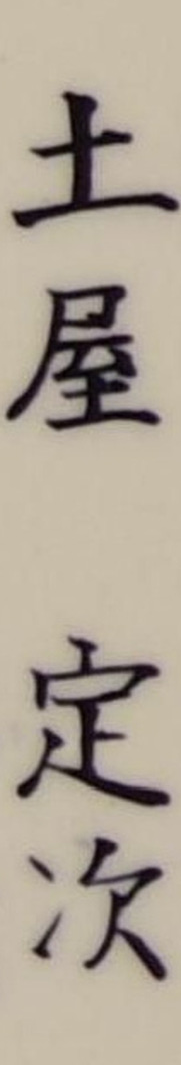土屋定次
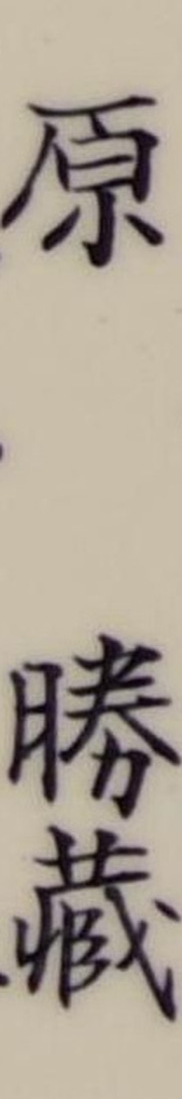原勝蔵
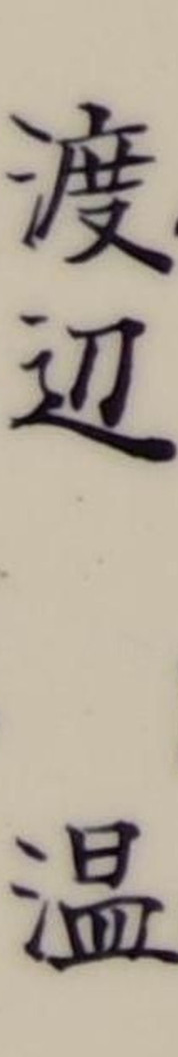渡辺温
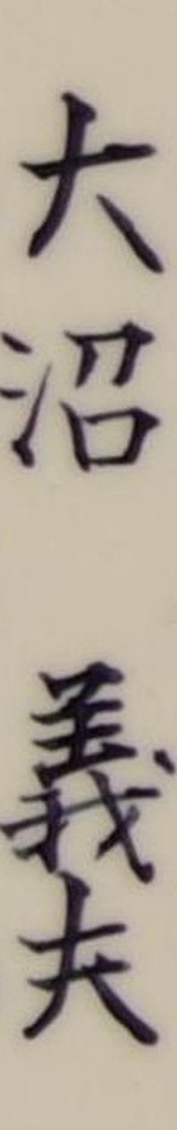大沼義夫
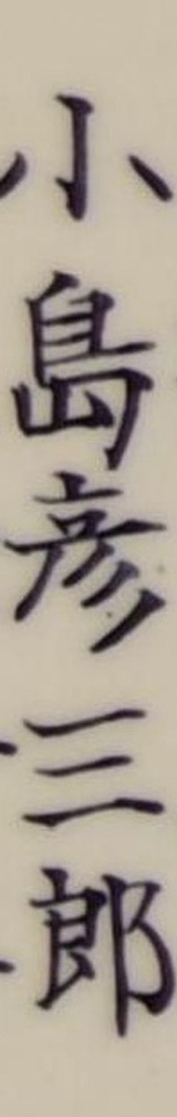小島彦三郎
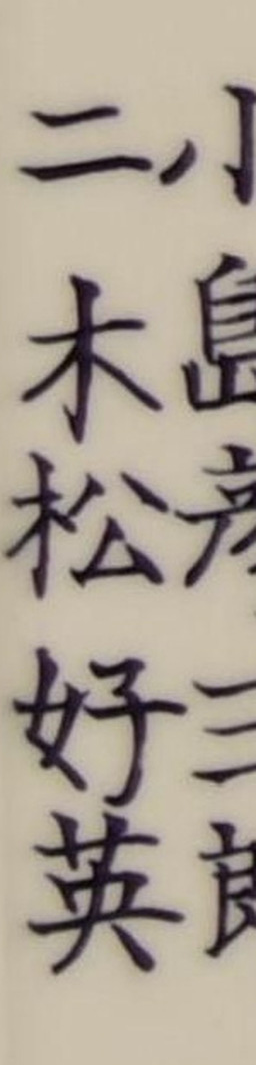二木松好英

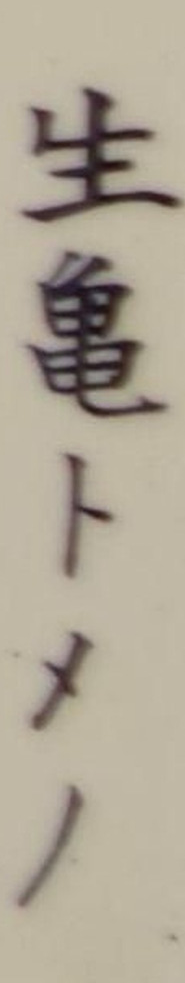生亀トメノ
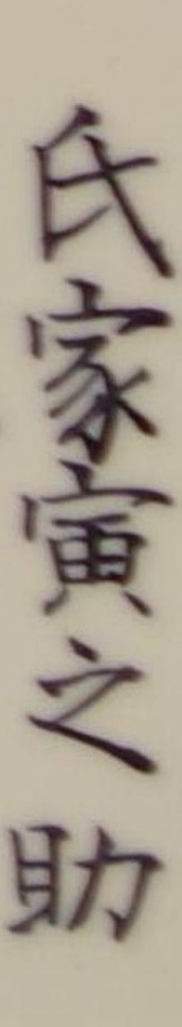氏家寅之助
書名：M~S
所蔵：高野山金剛峯寺
